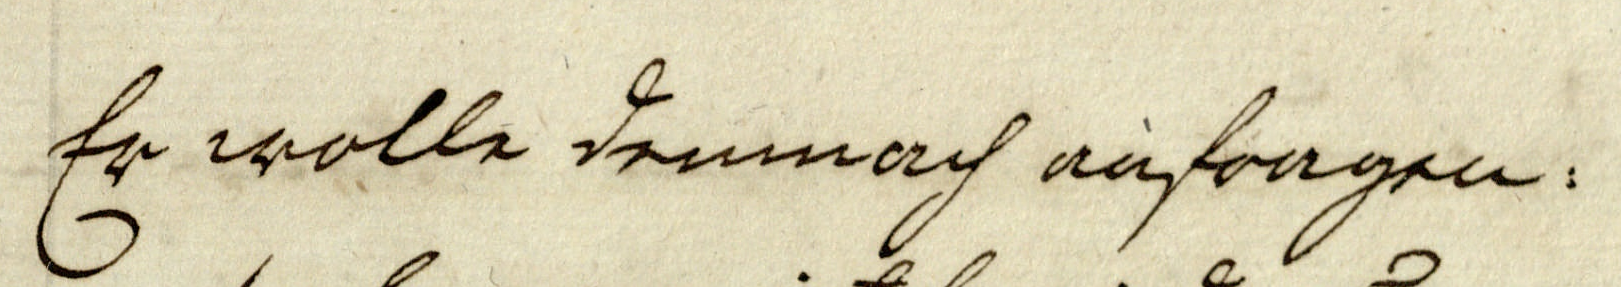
Er wolle demnach anfragen:
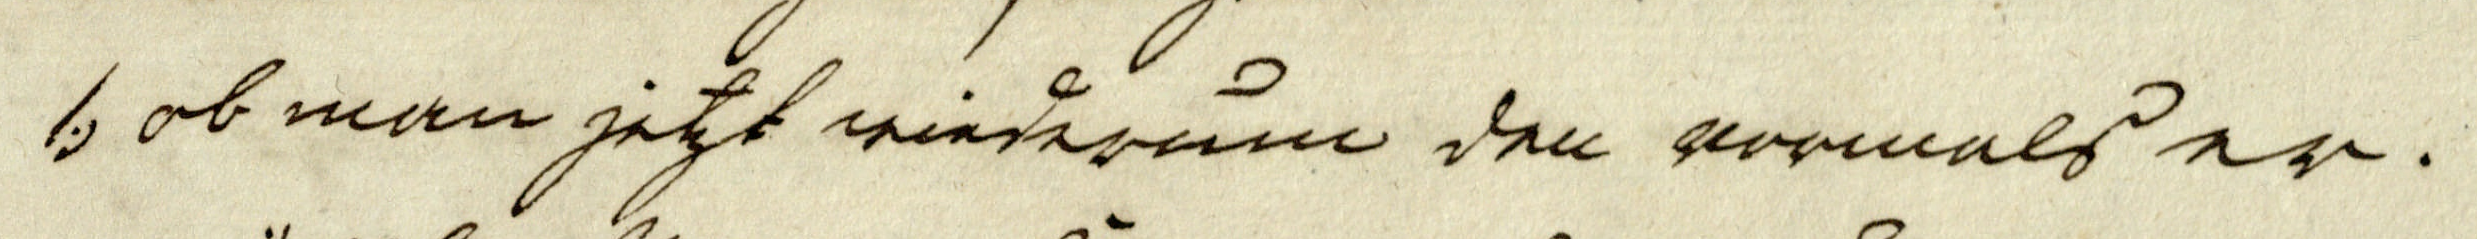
1., ob man jetzt wiederum den vormals er¬
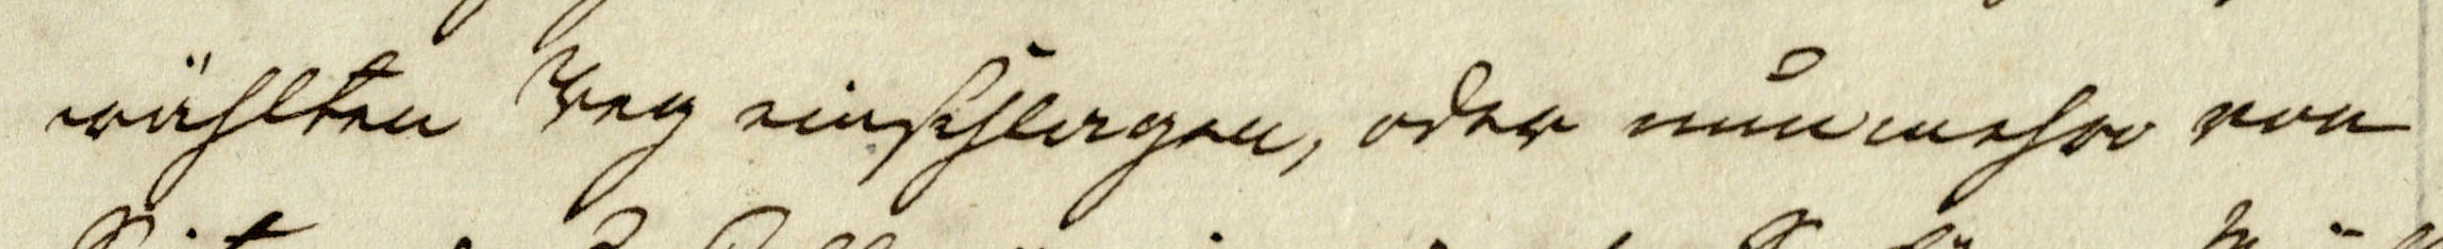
wählten Weg einschlagen, oder nunmehro von
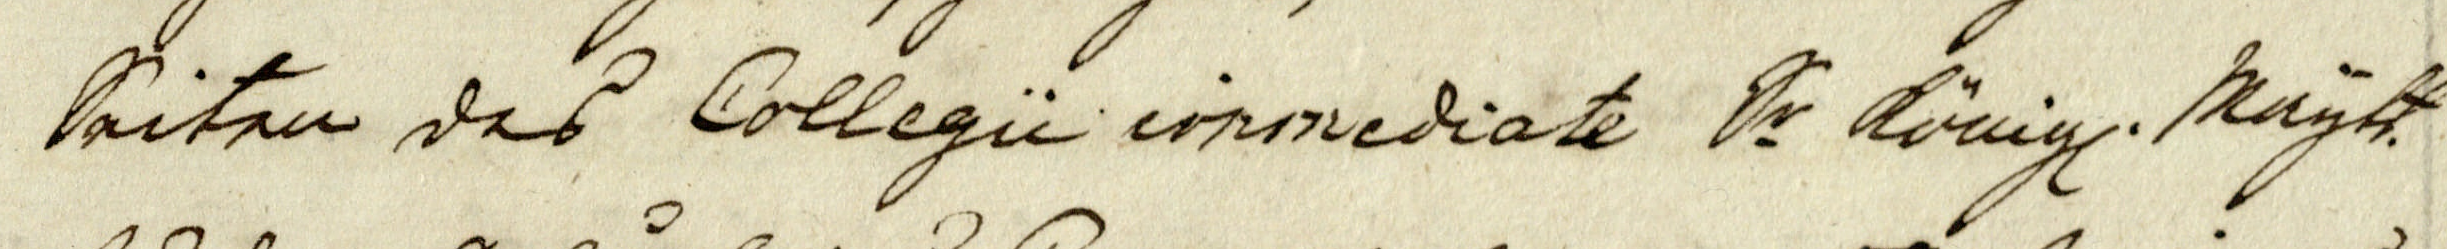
Seiten des Collegii immediate Sr Königl. Maÿtt.
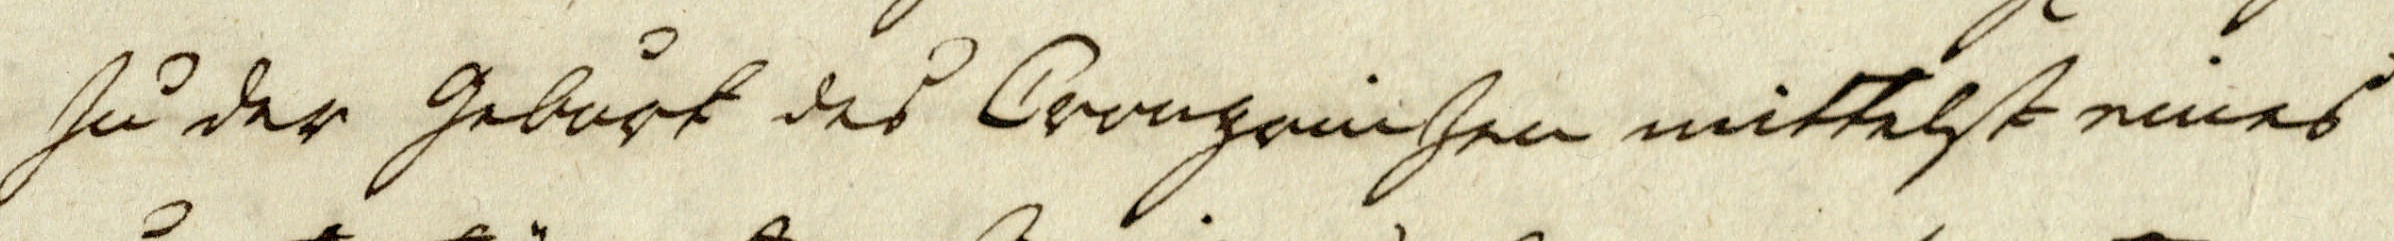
zu der Geburt des Cronprinzen mittelst eines
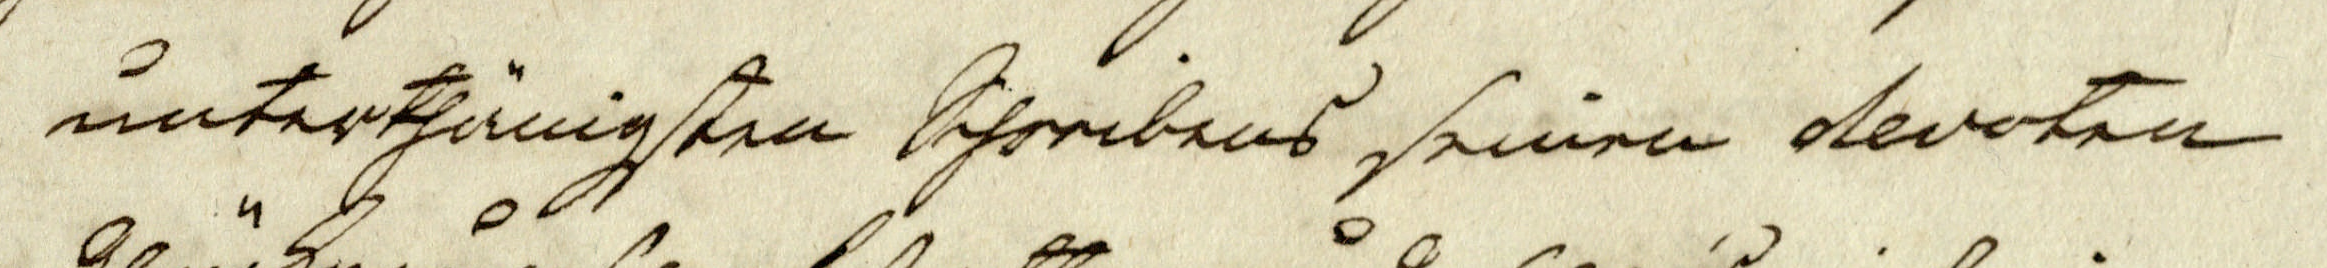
unterthänigsten Schreibens seinen devoten
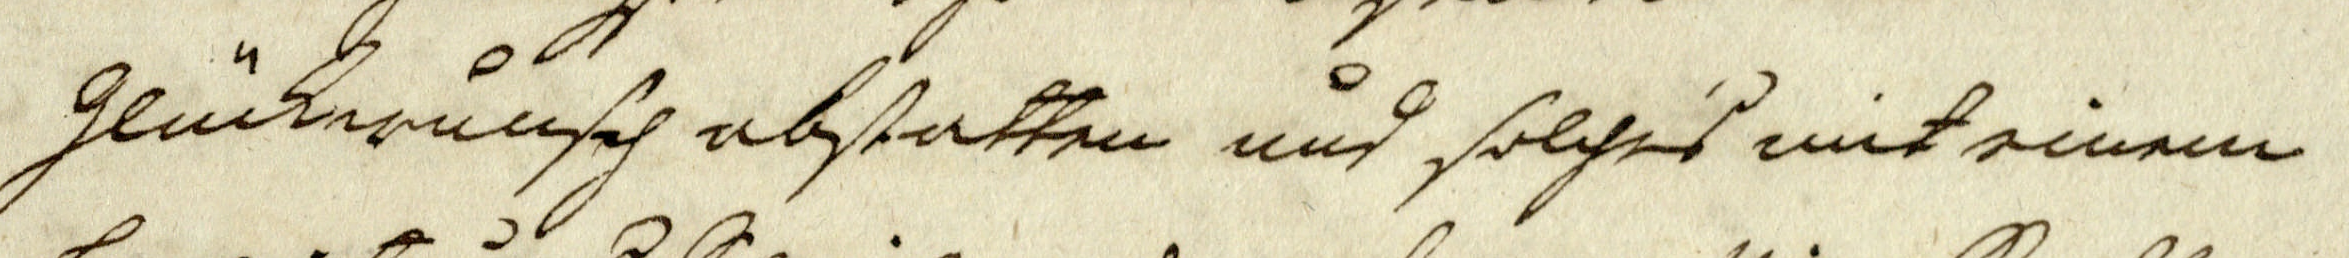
Glückwunsch abstatten und solches mit einem
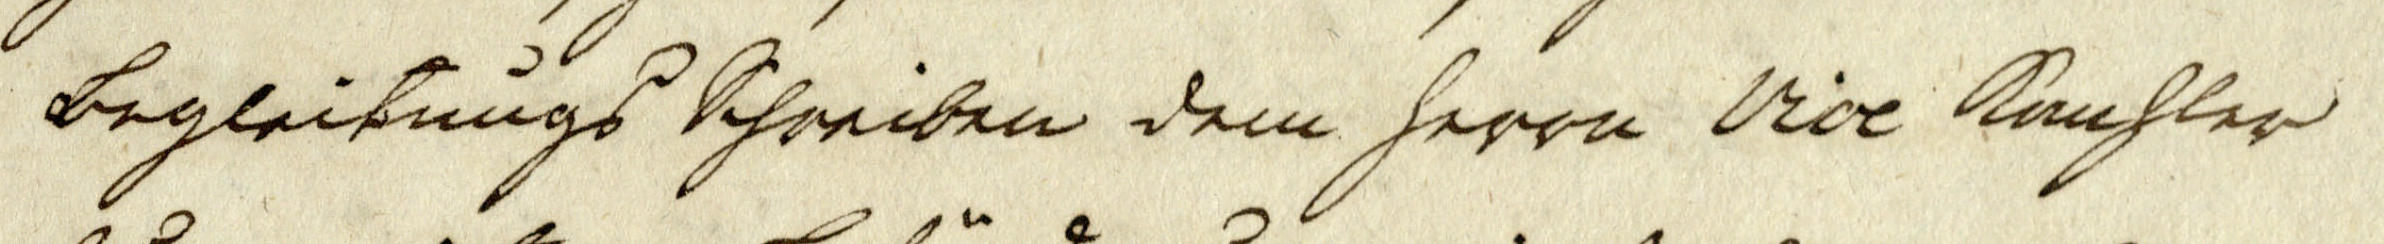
Begleitungs Schreiben dem Herrn Vice Kanzler
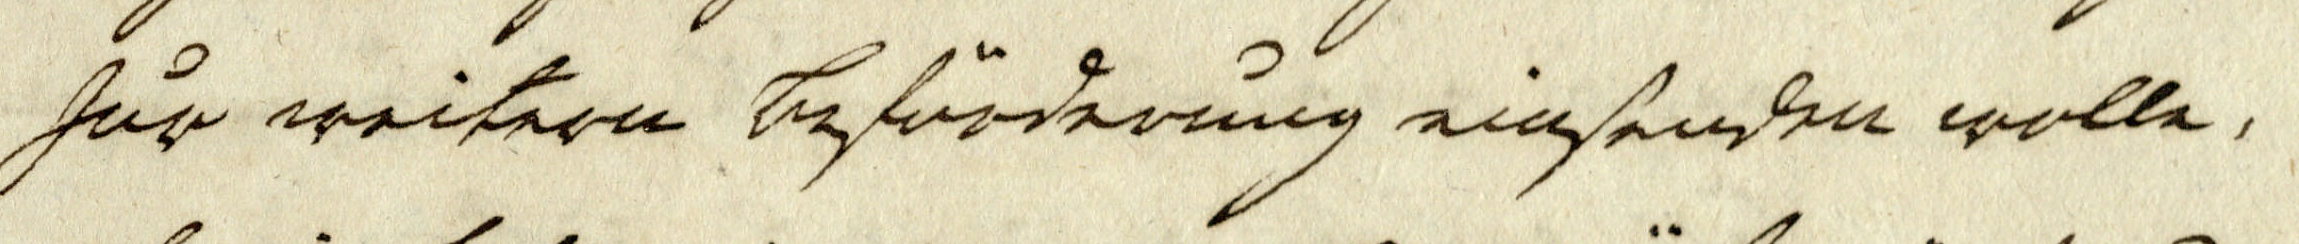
zur weitern Beförderung einsenden wolle,
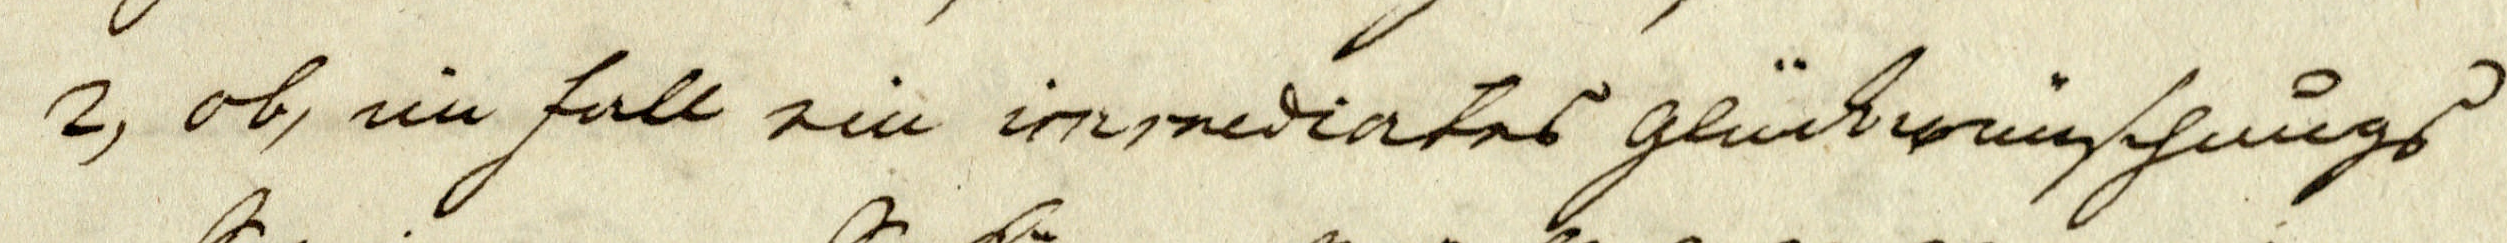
2, ob, im Fall ein immediates Glückwünschungs
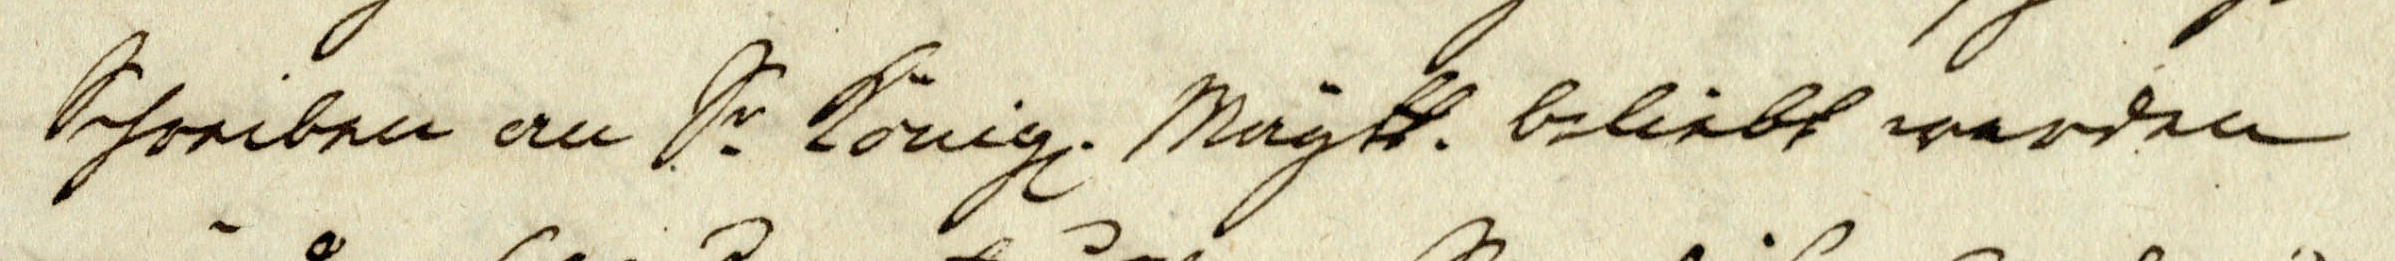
Schreiben an Sr Königl. Maÿtt. beliebt werden
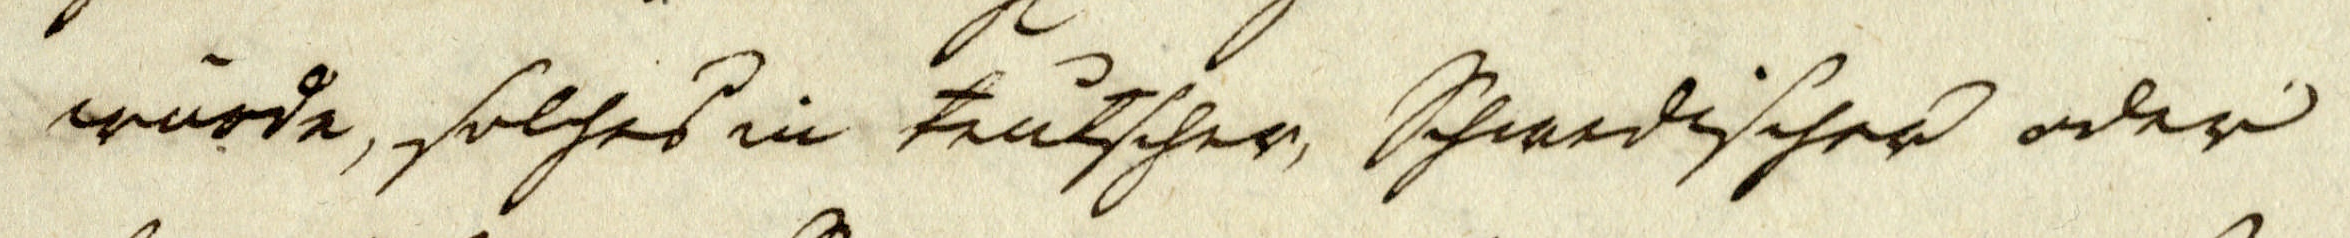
würde, solches in teutscher, Schwedischer der
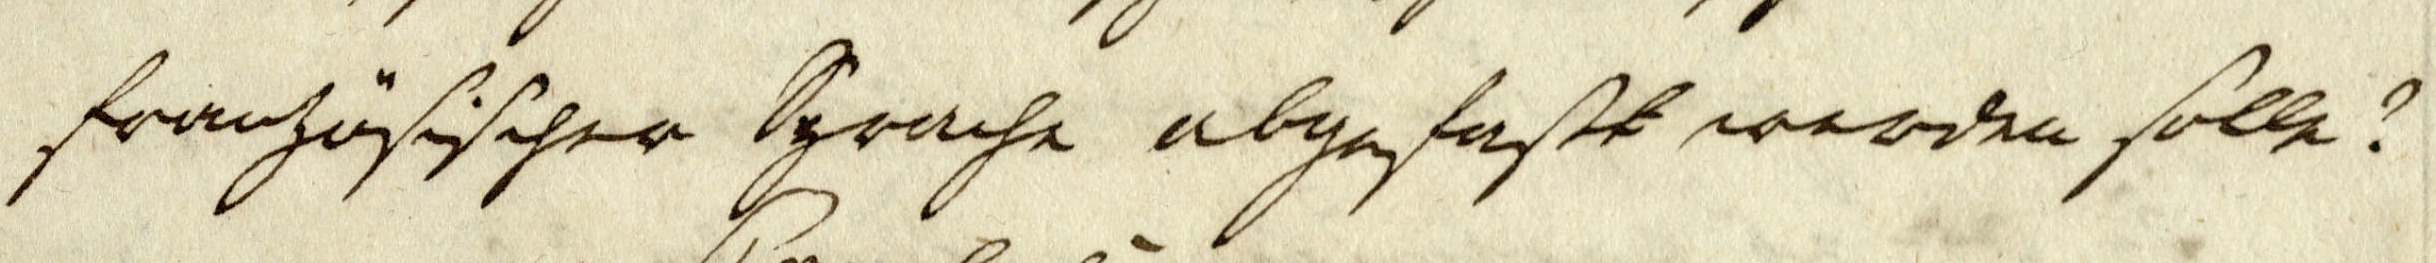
französischer Sprache abgefaßt werden solle?
